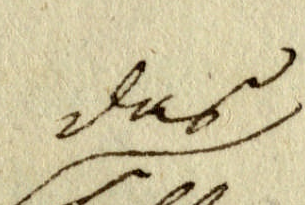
das
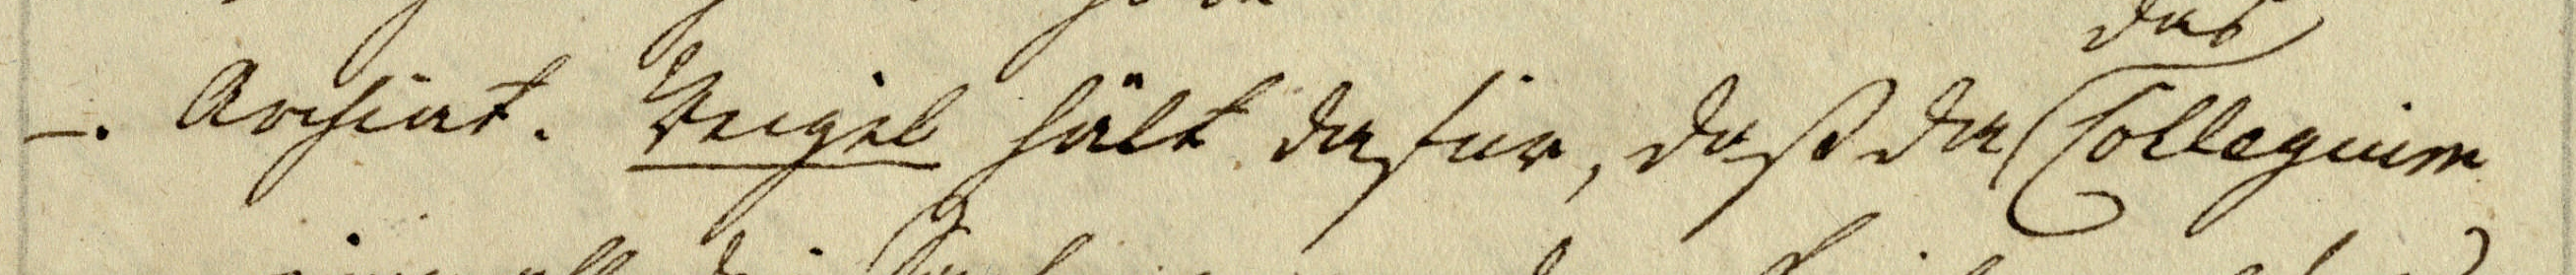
Archiat. Weigel hält dafür, daß da Collegium
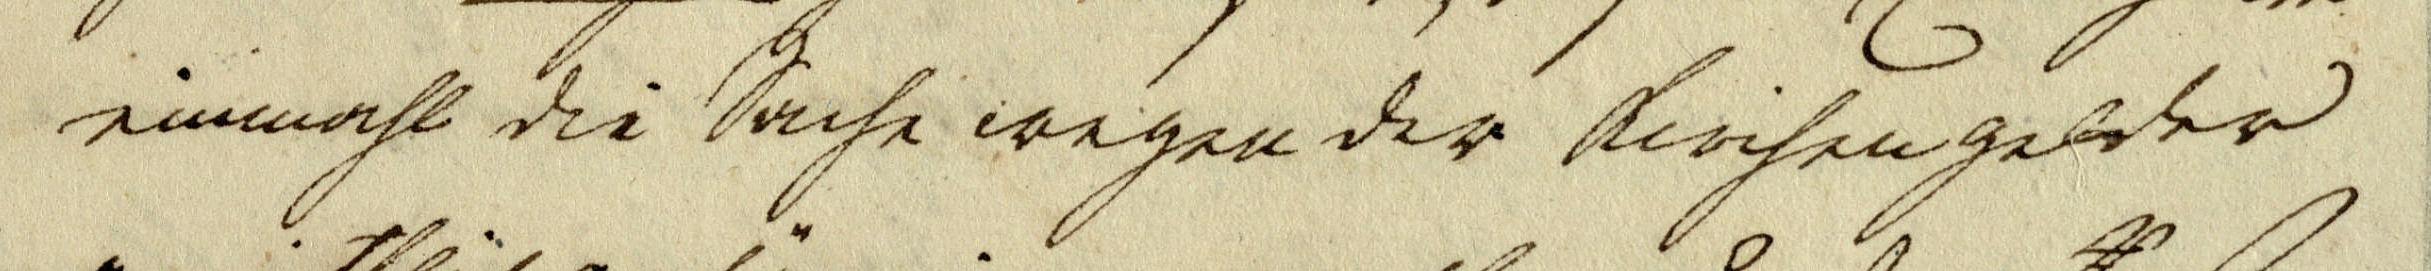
einmahl die Sache wegen der Kirchengelder
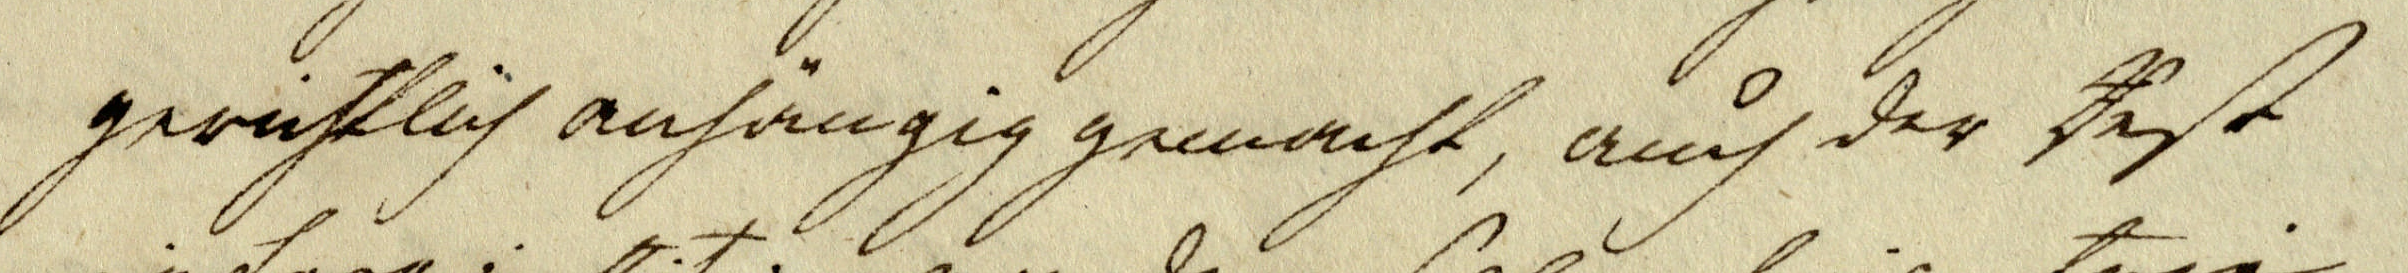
gerichtlich anhängig gemacht, auch der Rest
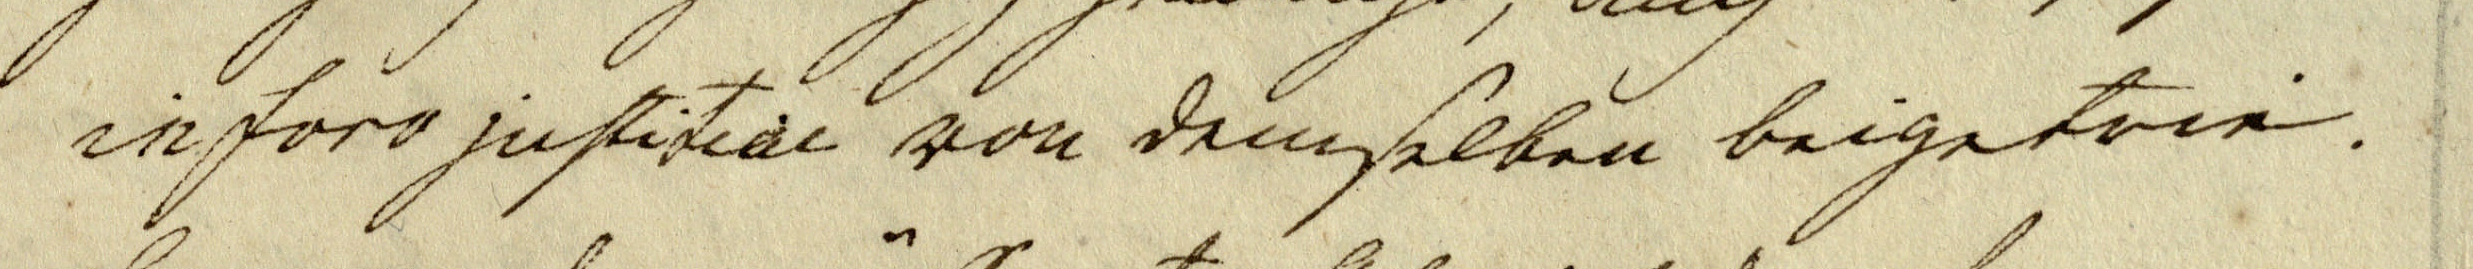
inforo justitiae von demselben beigetrie¬
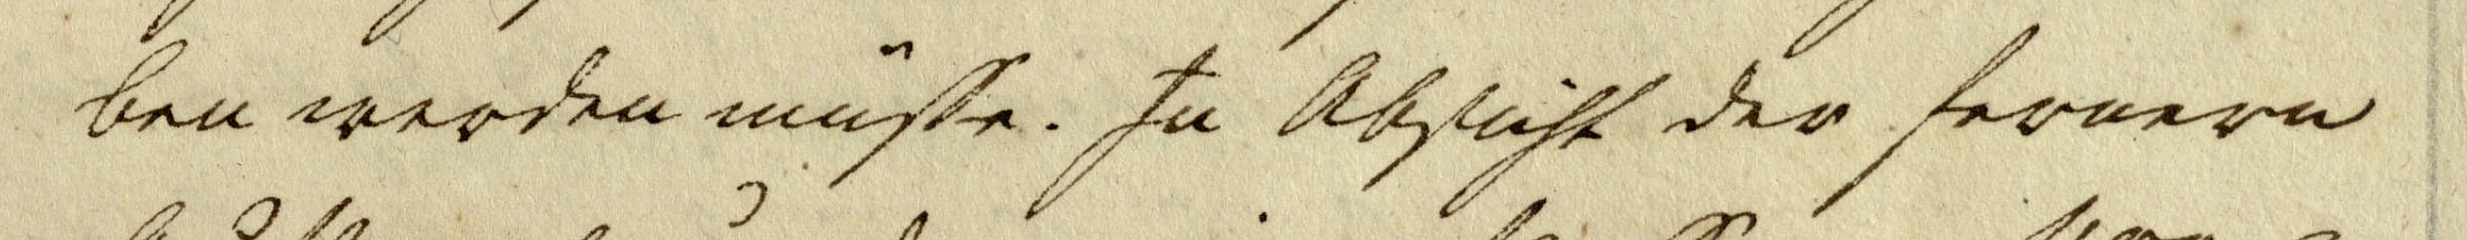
ben werden müsse. In Absicht der fernern
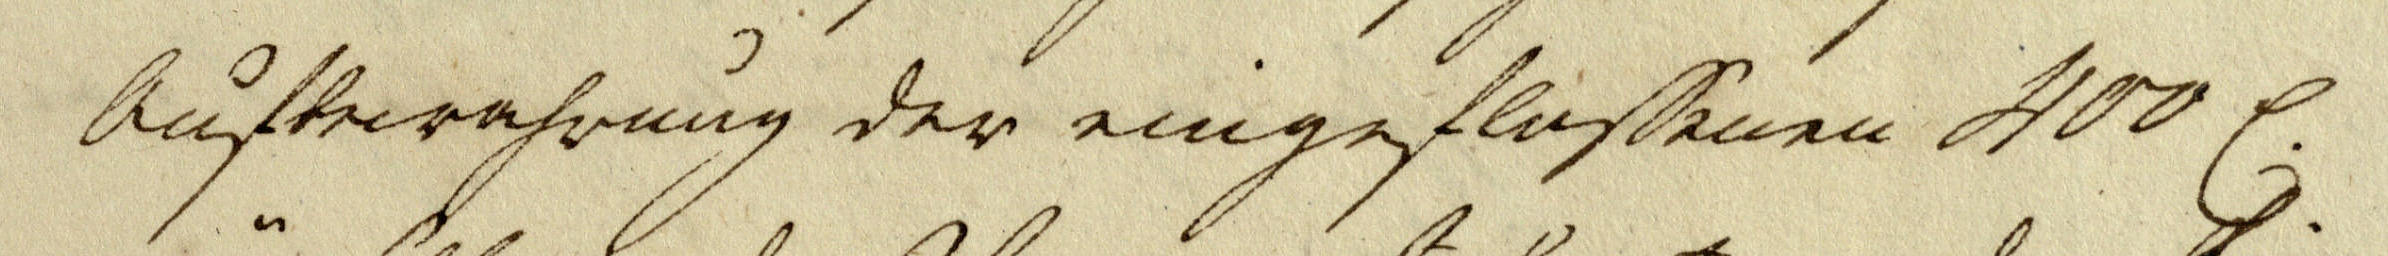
Aufbewahrung der eingeflossenen 400 l.
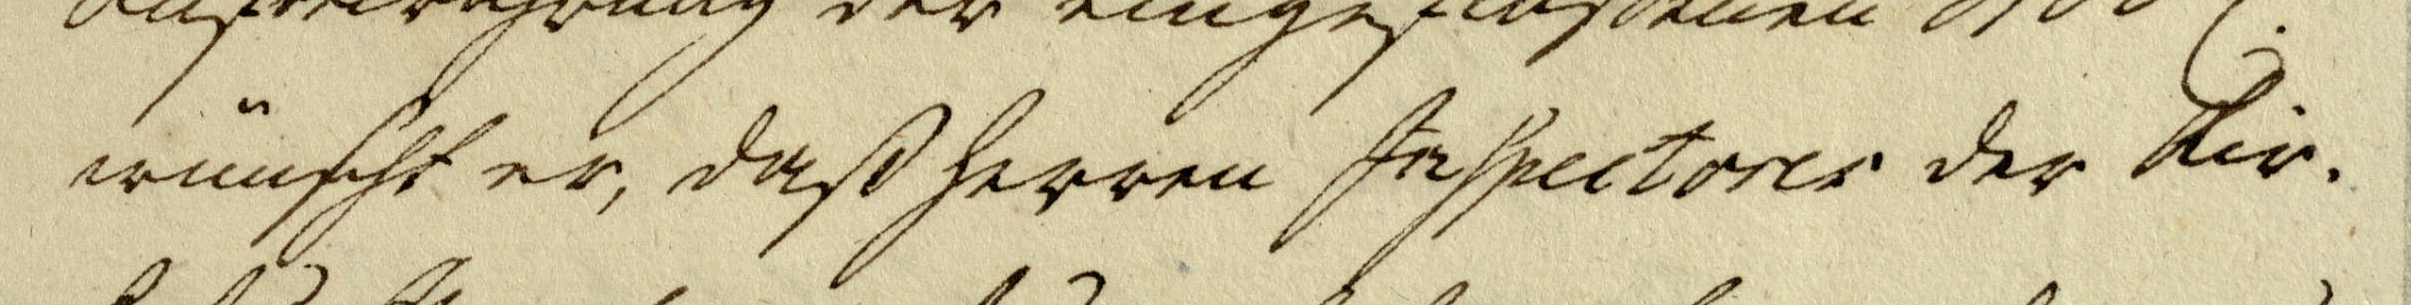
wünscht er, daß Herren Inspectores der Kir¬
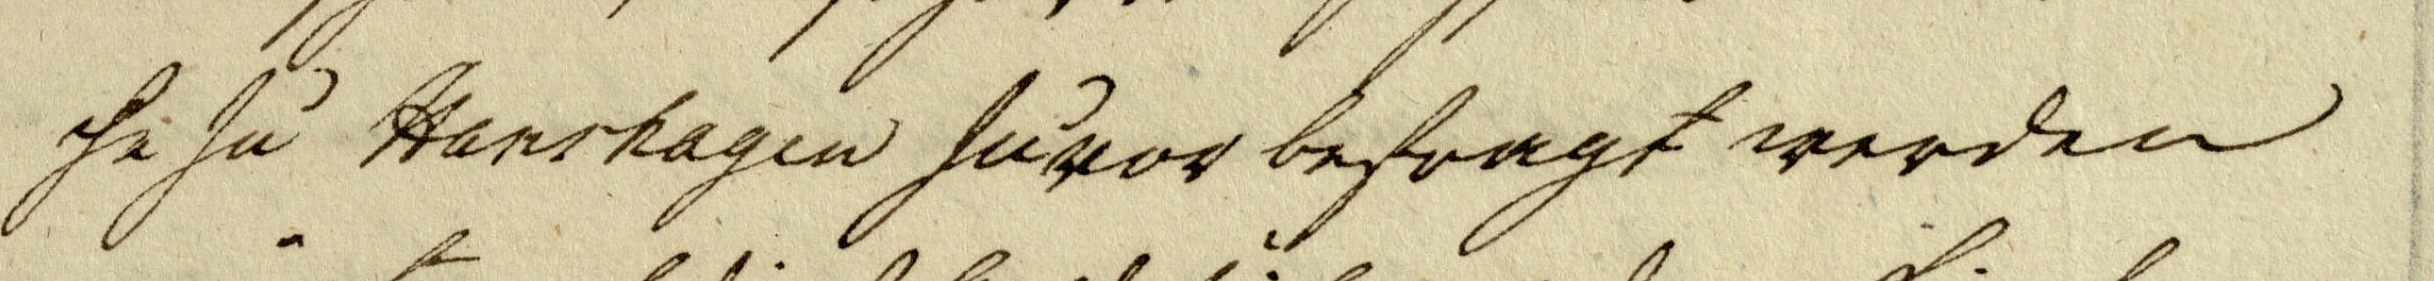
che zu Hanshagen zuvor befragt werden
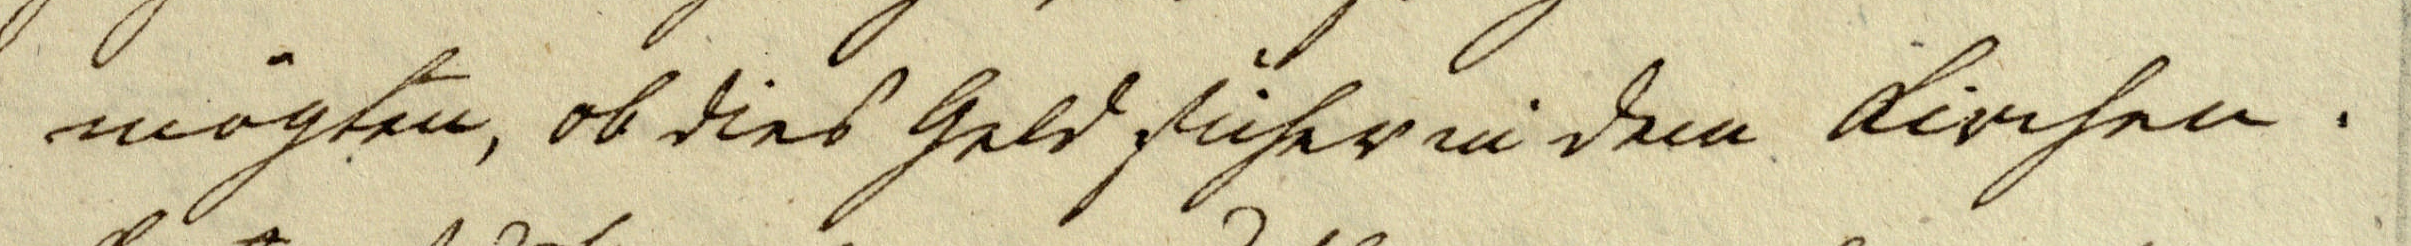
mögten, ob dies Geld sicher in dem Kirchen¬
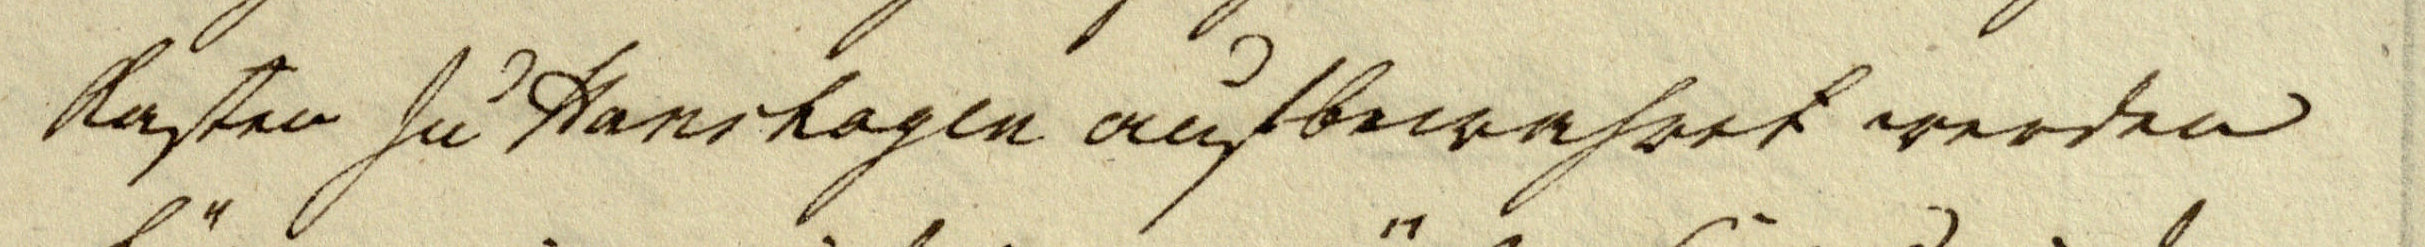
kasten zu Hanshagen aufbewahret werden
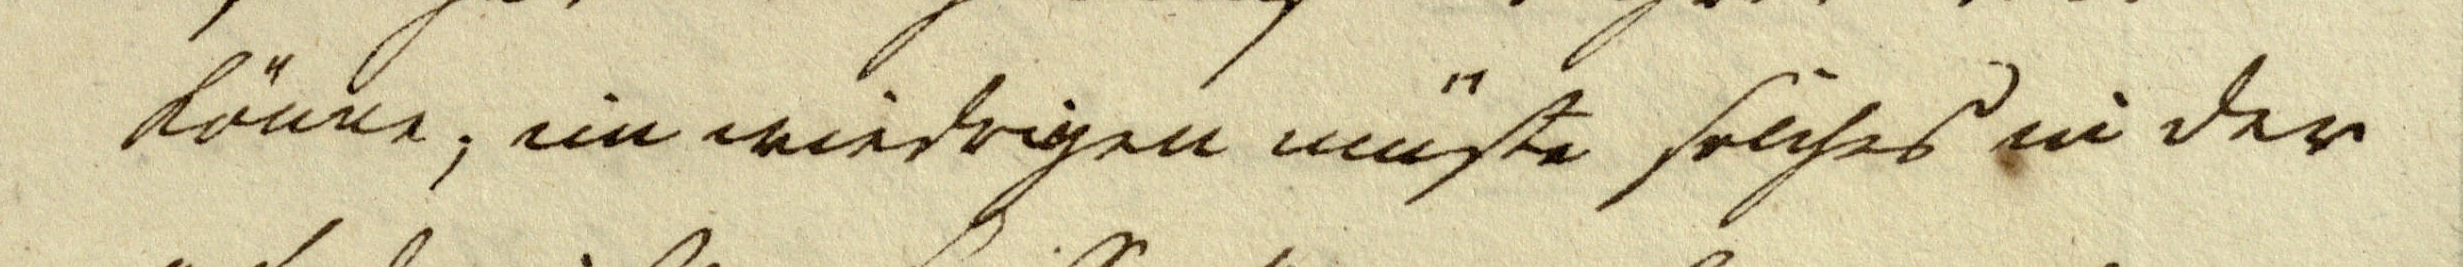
könne, im wiedrigen müßte solches in der
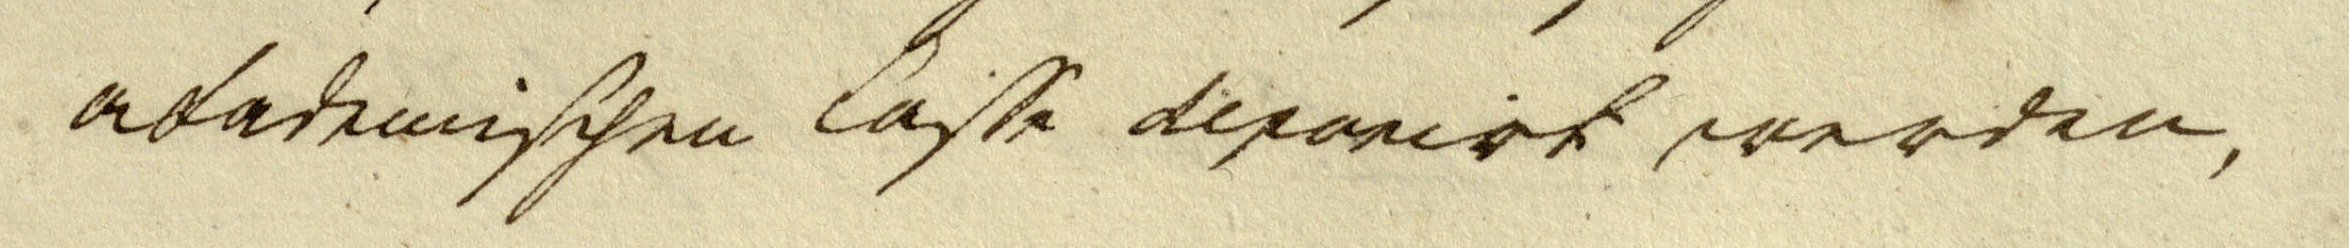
akademischen Casse deponirt werden,
